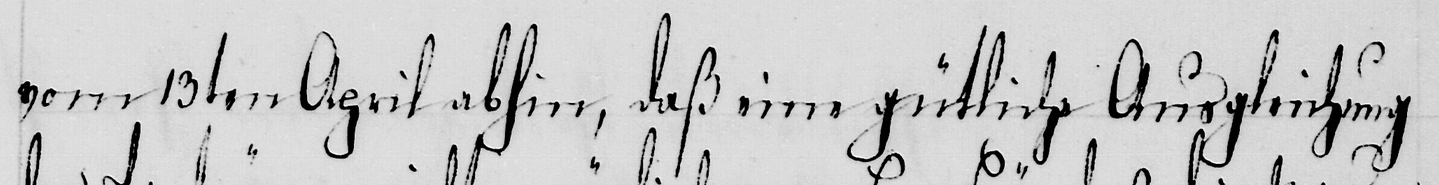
vom 13ten April abhin, das eine gütliche Ausgleichung
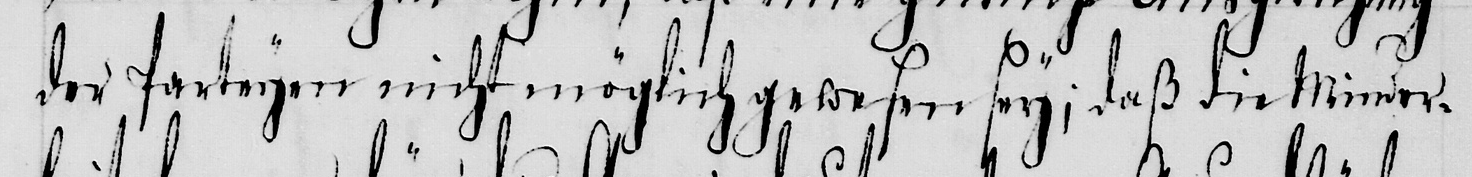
der Parteyen nicht möglich gewesen sey; daß die Minder¬
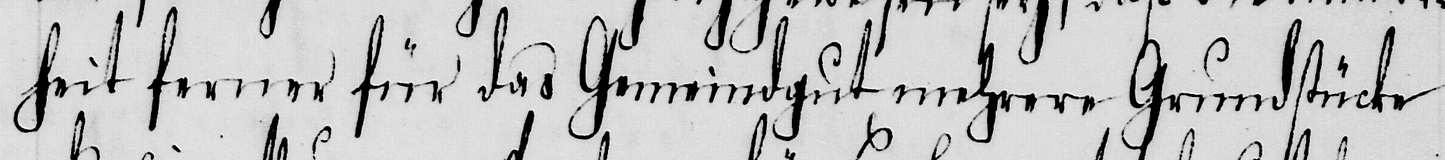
heit ferner für das Gemeindgut mehrere Grundstücke
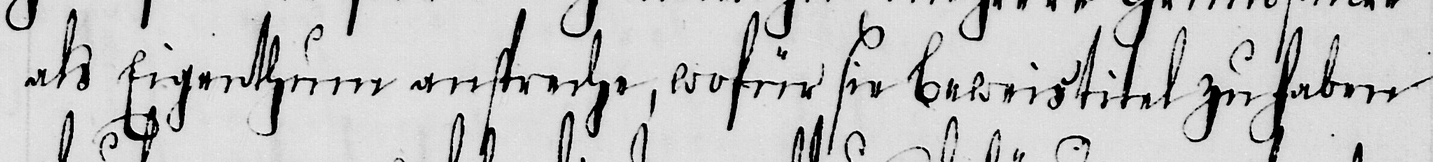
als Eigenthum anspreche, wofür sie Beweistitel zu haben
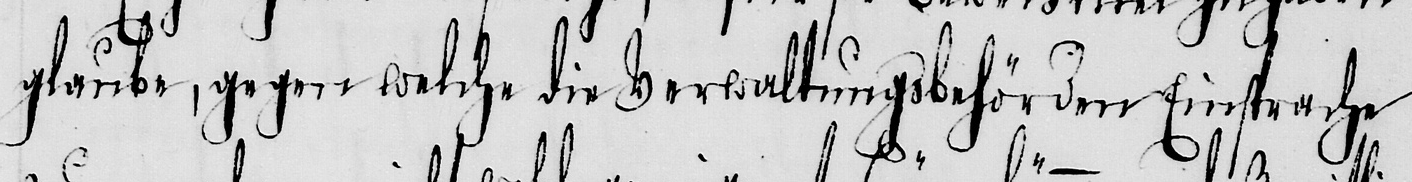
glaube, gegen welche die Verwaltungsbehörden Einsprache
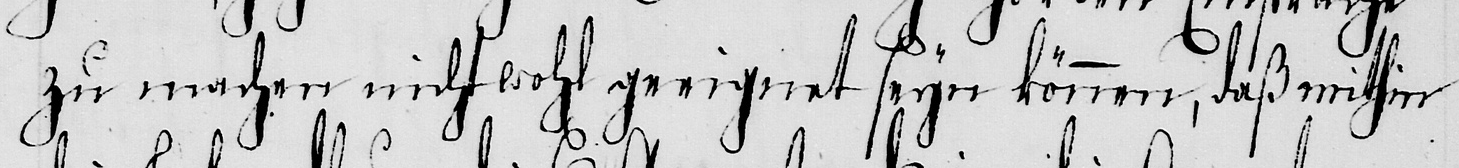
zu machen nicht wohl geeignet seyn können, daß mithin
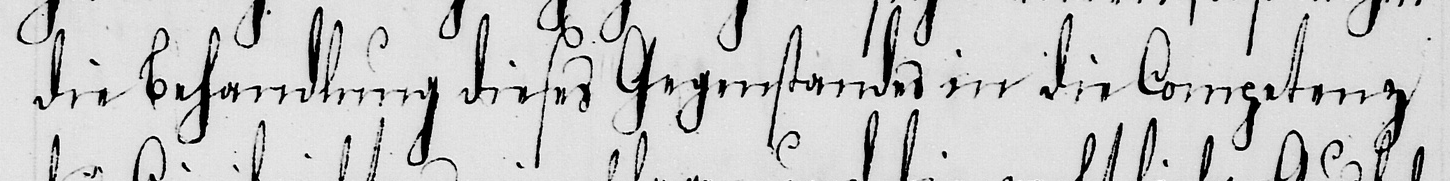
die Behandlung dieses Gegenstandes in die Competenz
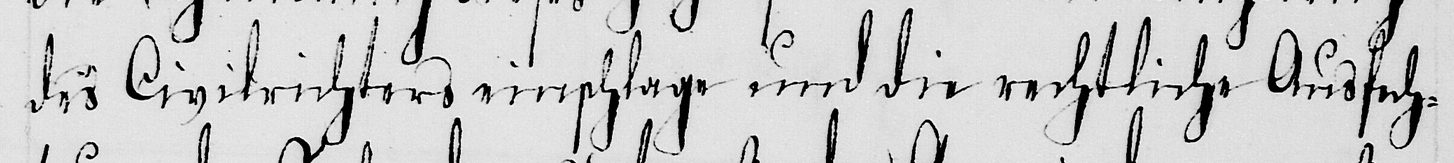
des Civilrichters einschlage und die rechtliche Ausfech¬
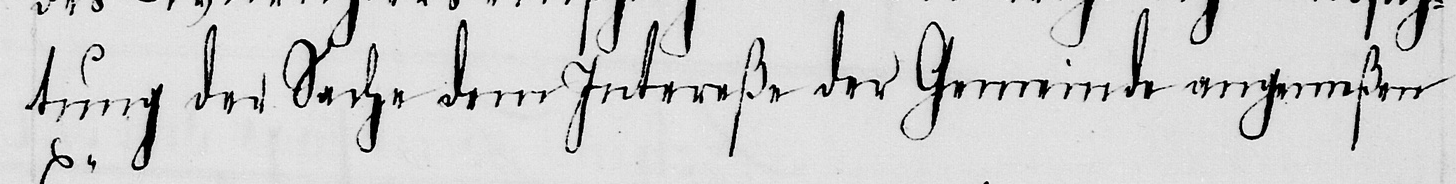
tung der Sache dem Intereße der Gemeinde angemeßen
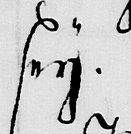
sey.
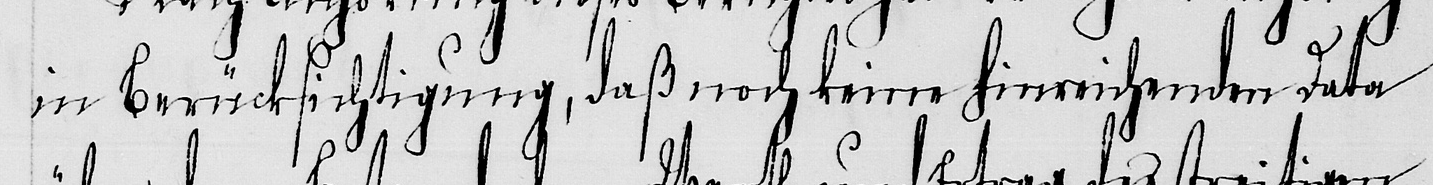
in Berücksichtigung, daß noch keine hinreichenden Data
